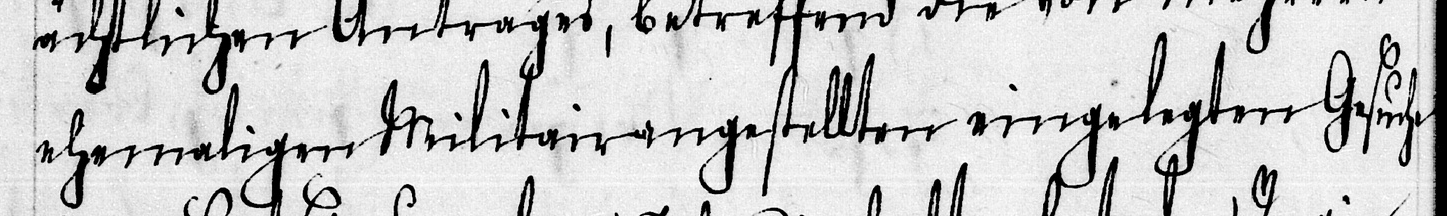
ehemaligen Militairangestellten eingelegten Gesuc¬
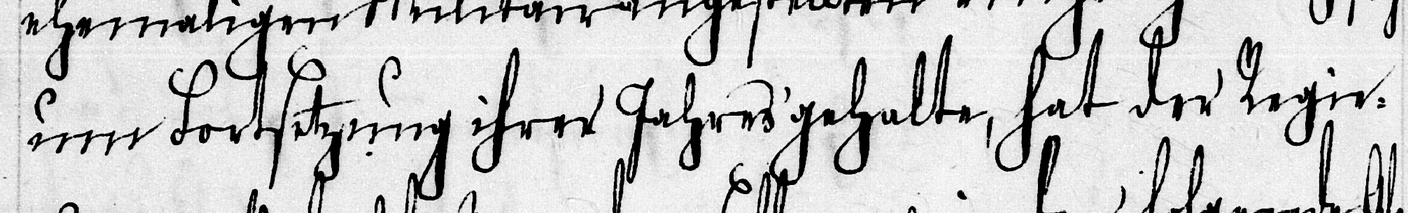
um Fortsetzung ihrer Jahresgehalte, hat der Regie¬
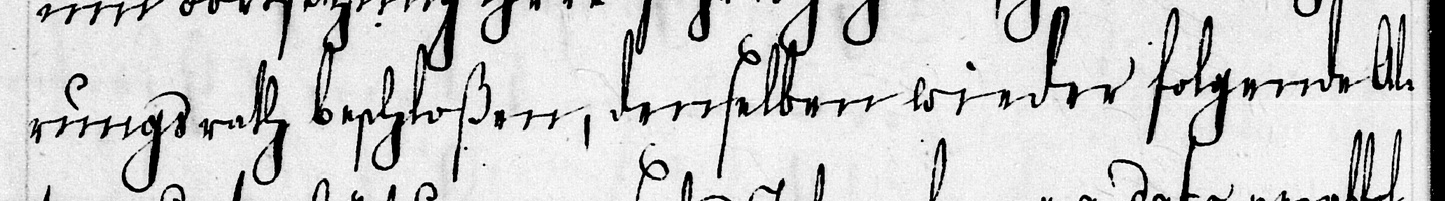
rungsrath beschloßen, denselben wieder folgende Al¬
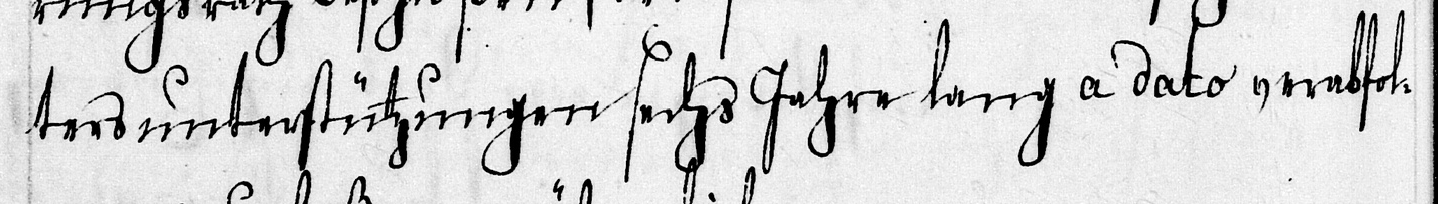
tersunterstützungen sechs Jahre lang a dato verabfol¬
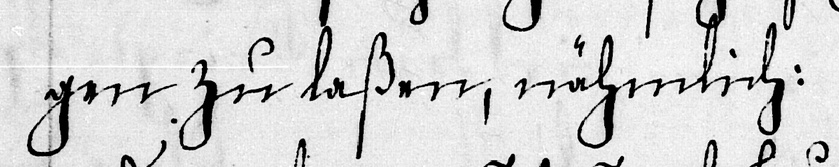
gen zu laßen, nähmlich:
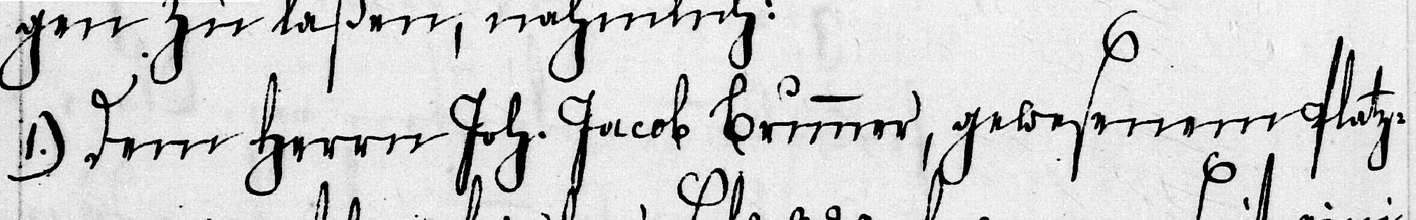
1.) Dem Herrn Joh. Jacob Brunner, gewesenem Plat¬
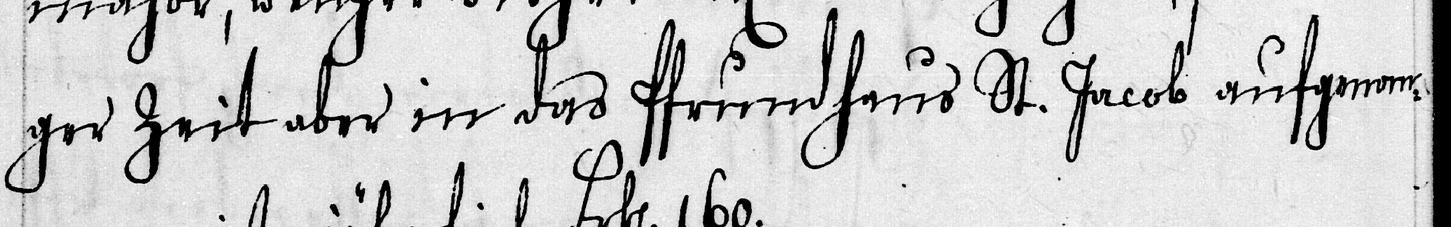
ger Zeit aber in das Pfrundhaus St. Jacob aufgenom¬
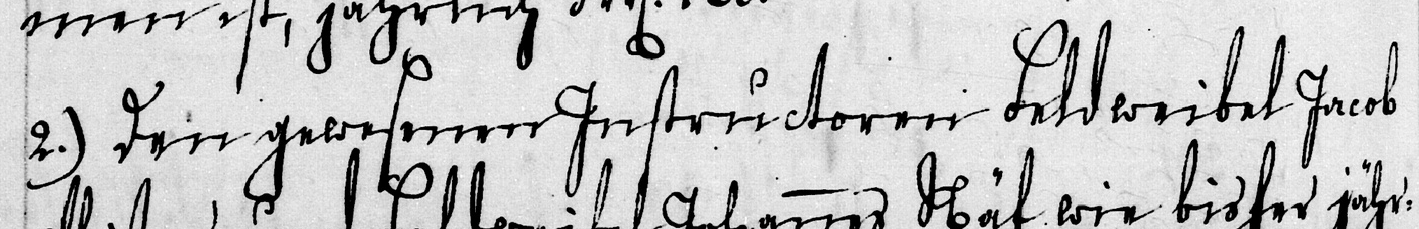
2.) Den gewesenen Instructoren Feldweibel Jacob
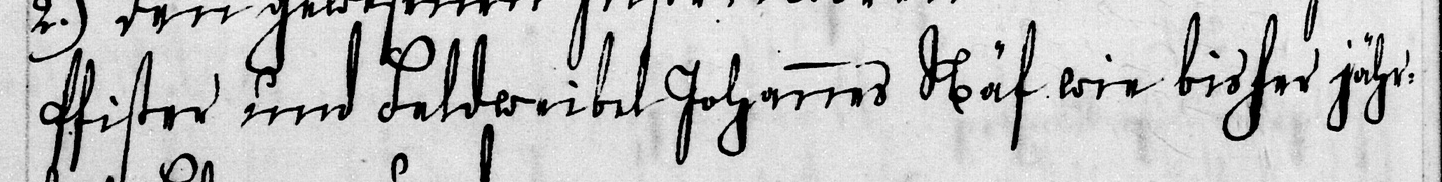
Pfister und Feldweibel Johannes Näf wie bisher jähr¬
